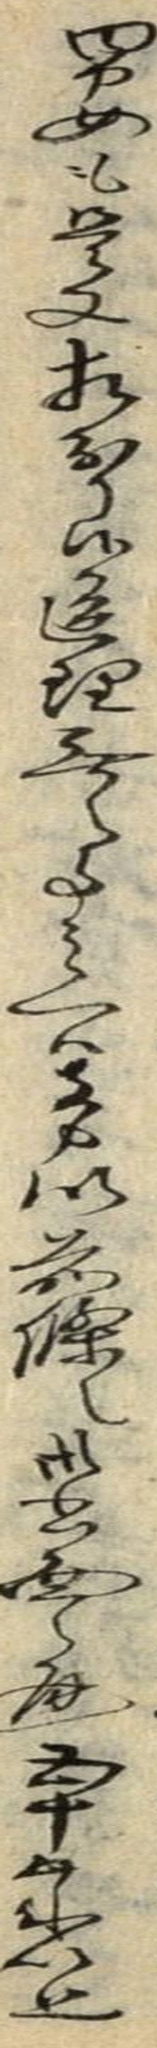男女も是又相分り候道理無之事ニ候へハ旁以前条之御書面之通五十歳以上
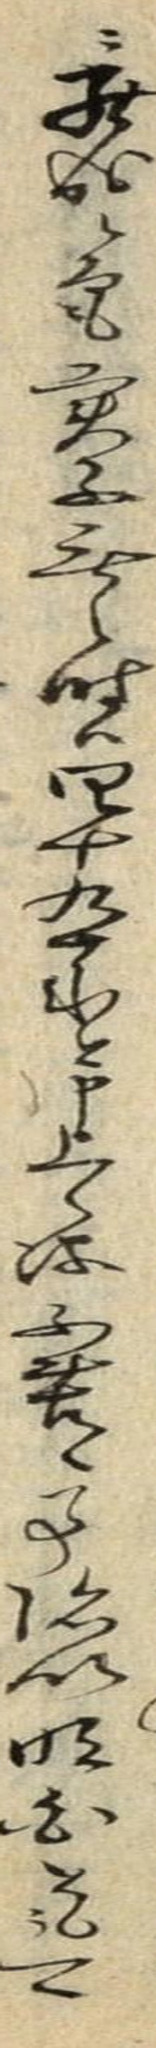ニ罷成候而も実子無之時ハ四十九歳と申上候儀不苦候事跡以明白とも可
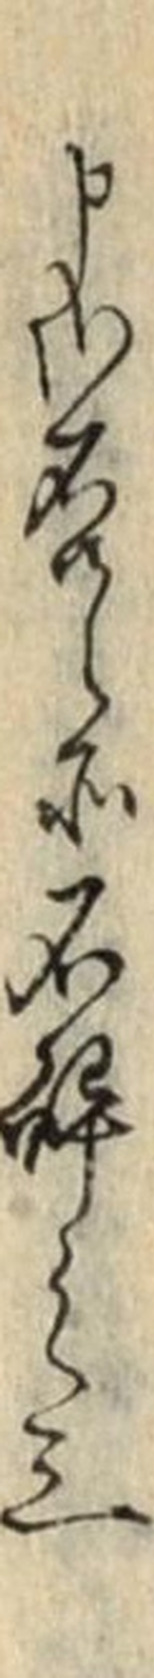申哉否之所不解之三
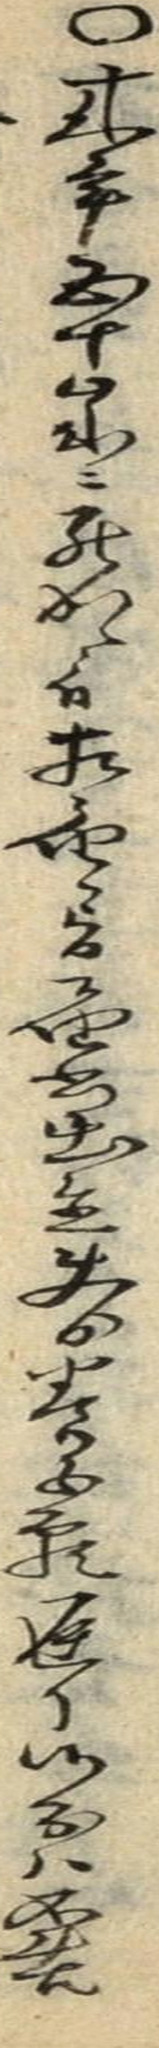〇来年五十歳ニ罷成候ニ付相届候旨届書出置夫ゟ養子願遅り候分ハ不苦
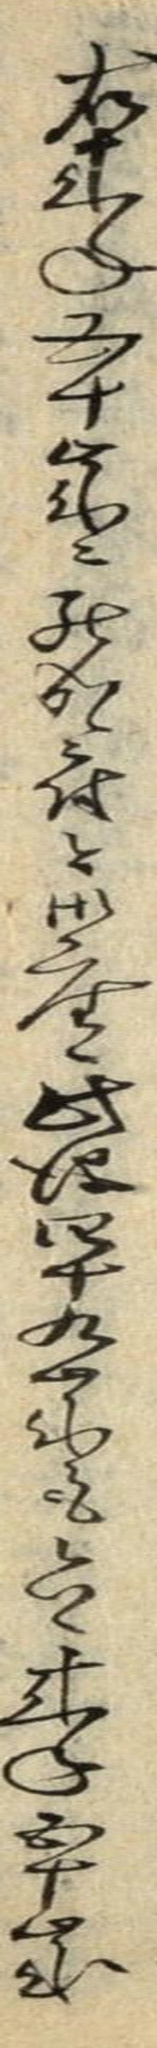右来年五十歳ニ罷成候ニ付と御座候此儀四十九歳ニも候ハヽ来年五十歳
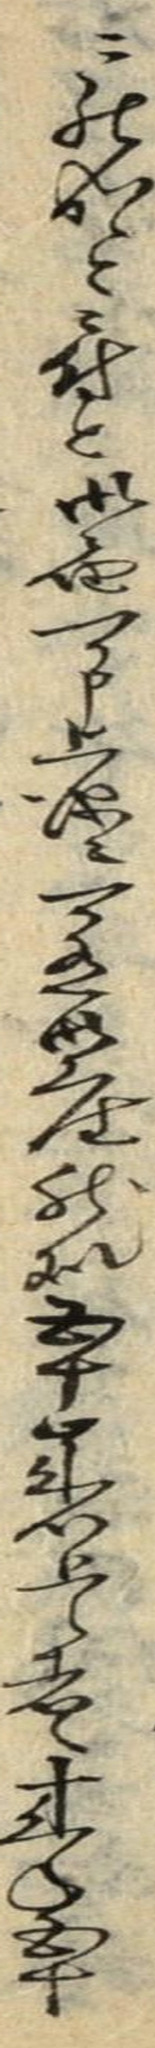ニ罷成候とニ付と御届可申上儀ニ可有御座然処五十歳以上之者へ来年五十
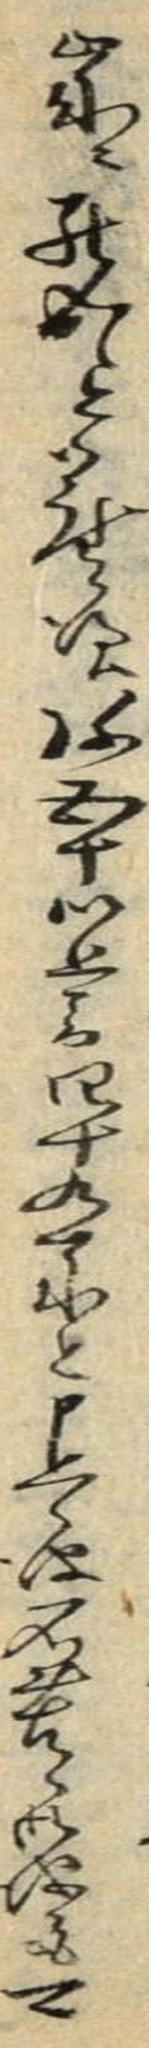歳ニ罷成候と御座候得ハ弥五十以上ニ而四十九歳と申上候儀不苦候御儀ニも可

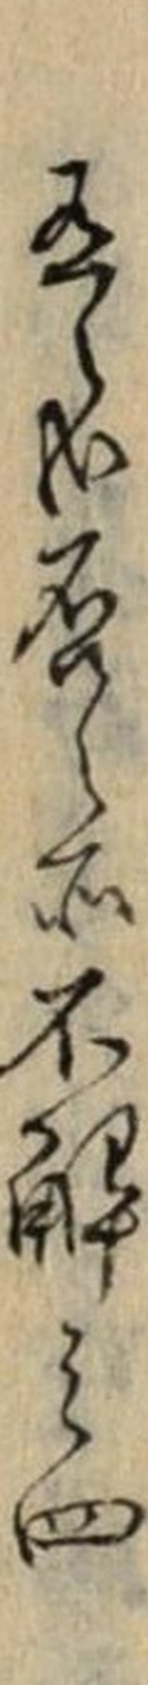有之哉否之所不解之四
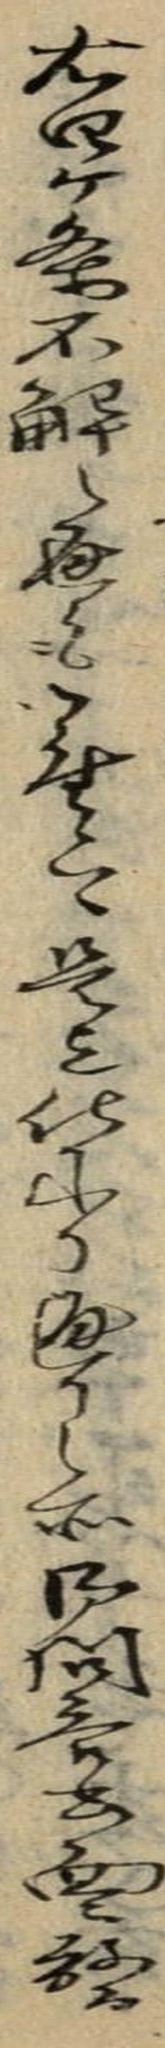右四ケ条不解之通りも御座候ハヽ是迄仕来り通り之所御門答書面ニ敢而
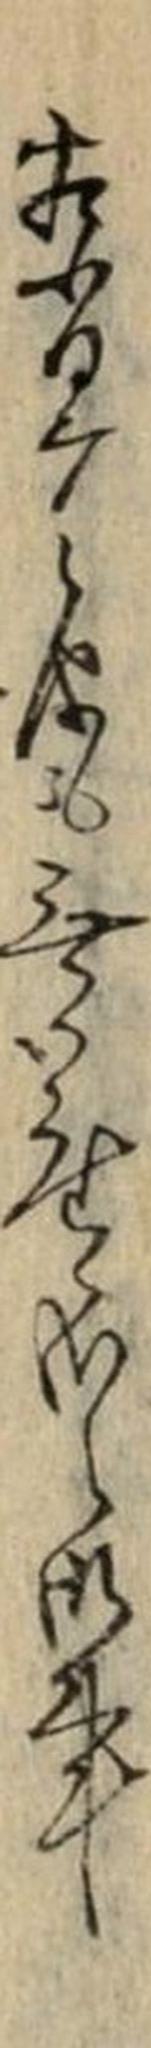相背ケ候儀も無御座候哉之御事
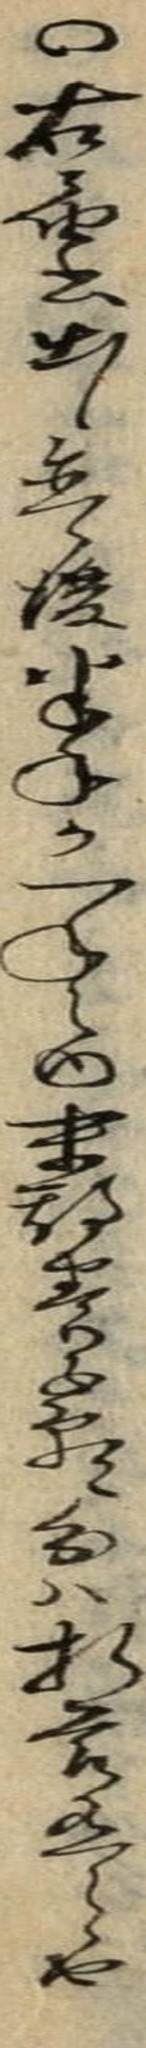〇右届書出し置後半年か一年之内末期養子願候分ハ折節有之候由
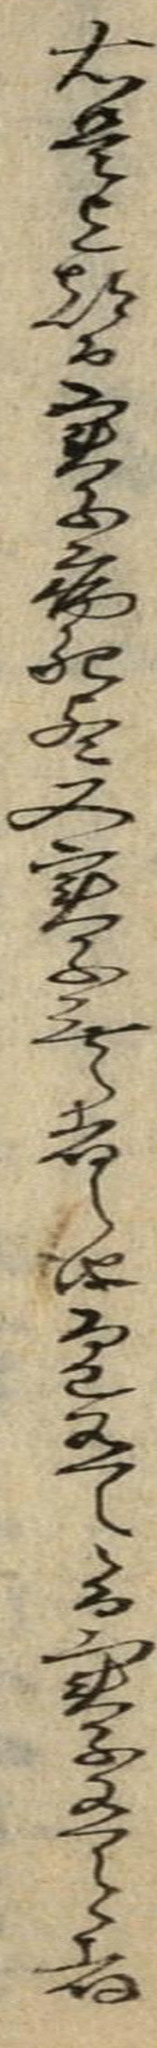右是迄凡都而実子病死歟又実子無之者之儀而已有之候而実子有之者
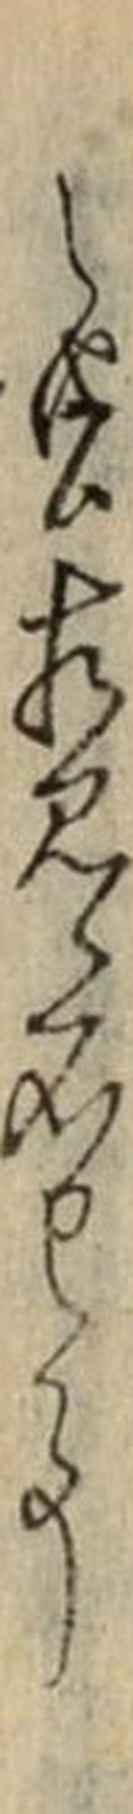之儀ハ相見へ不申候事
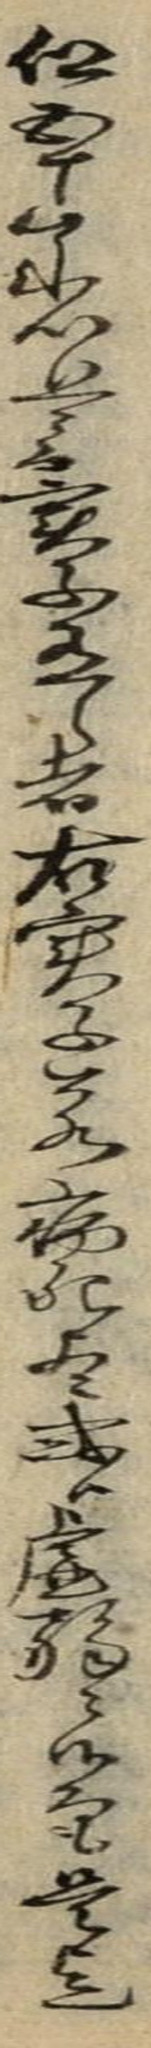但五十歳以上ニ而実子有之者右実子若病死歟或ハ虚弱ニ候而も是迄
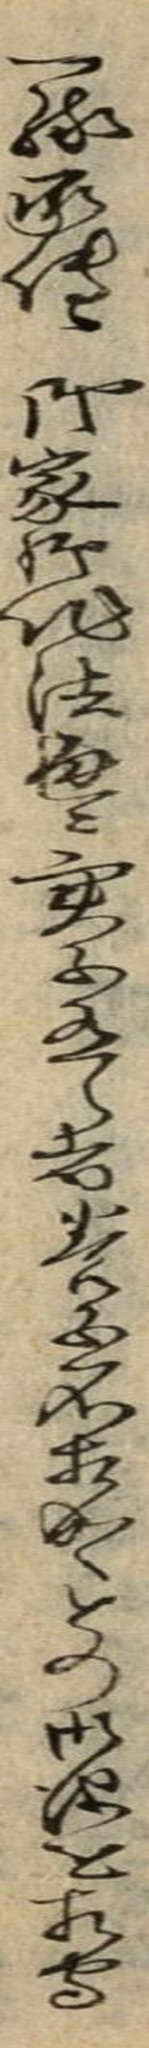一統承伝候御家御作法通ニ実子有之者養子不相成候との御儀を相守
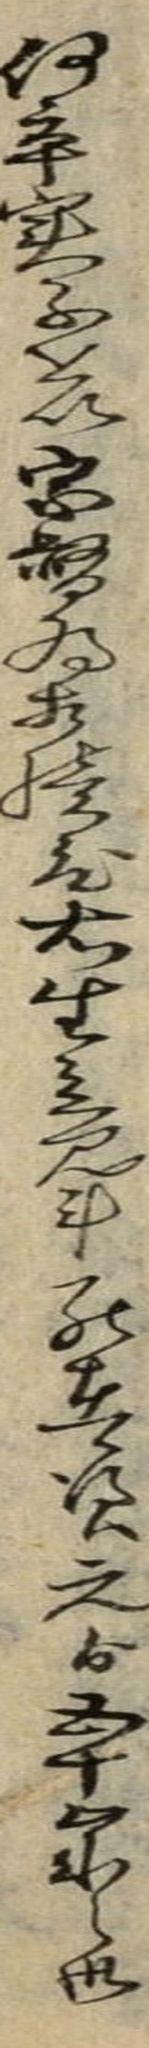何卒実子を以家督為相続度右生立見計罷在候得ハ元ゟ五十歳之御
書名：養子縁組之部
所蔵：福井県文書館 Fukui Prefectural Archives
